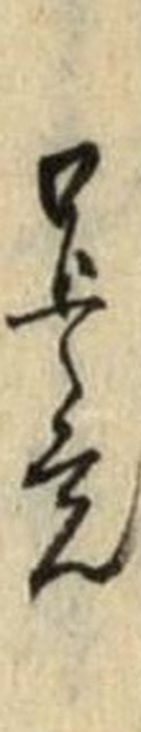口上之覚
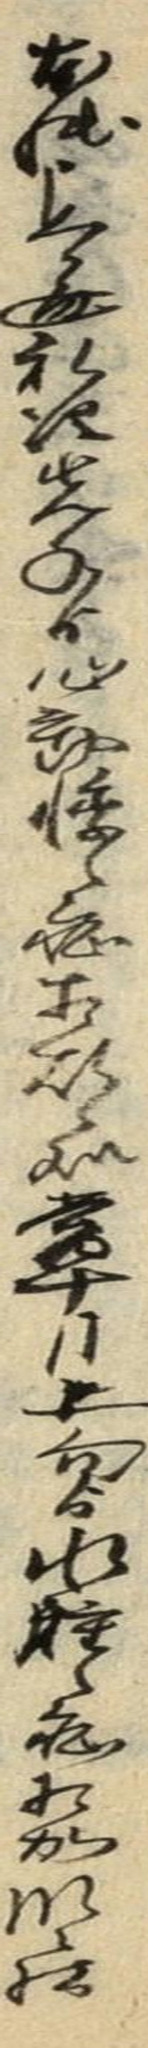本紙申上候通私儀先年ゟ心動悸之症相煩候処当十月上旬ゟ水腫之症相加段々指
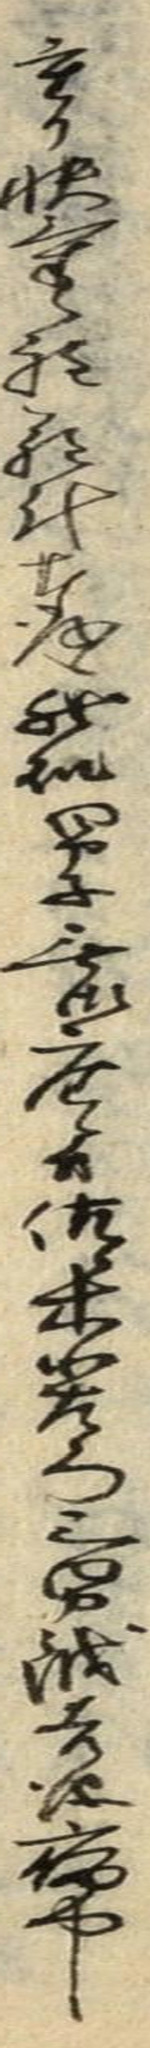重ク快気之程難計奉存候然処男子無御座候ニ付佐々木小左衛門三男誠吉儀病中
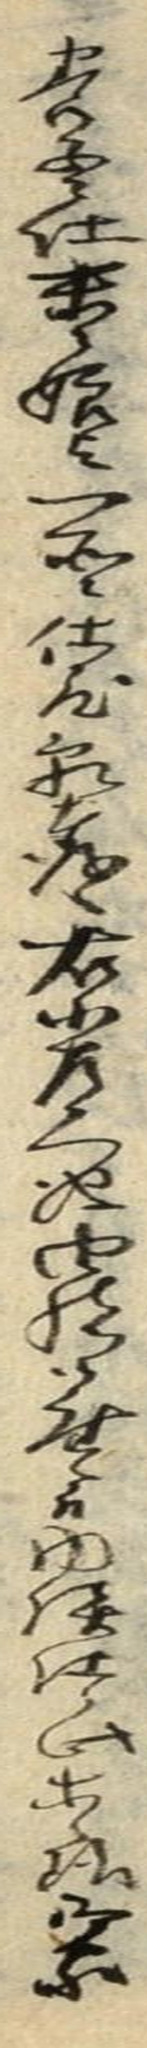養子ニ仕末々娘与一所ニ仕度願奉存候右小左衛門儀由緒御座候ニ付内談仕候此等之趣御家
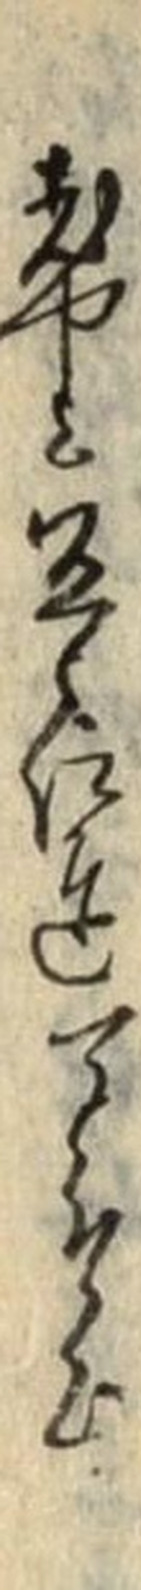老中迄宜被仰達可被下候已上
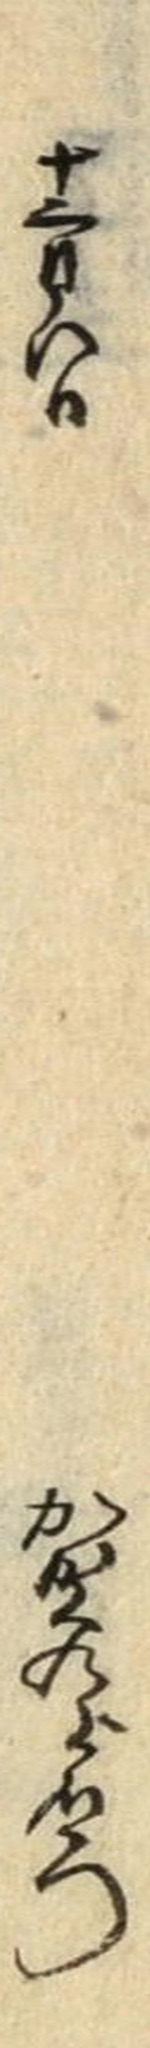十二月八日加賀九郎右衛門
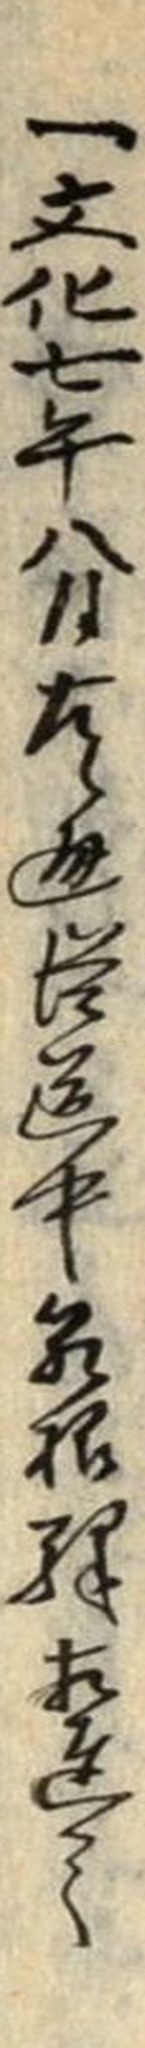一文化七年八月左之通従道中箱根駅相達之
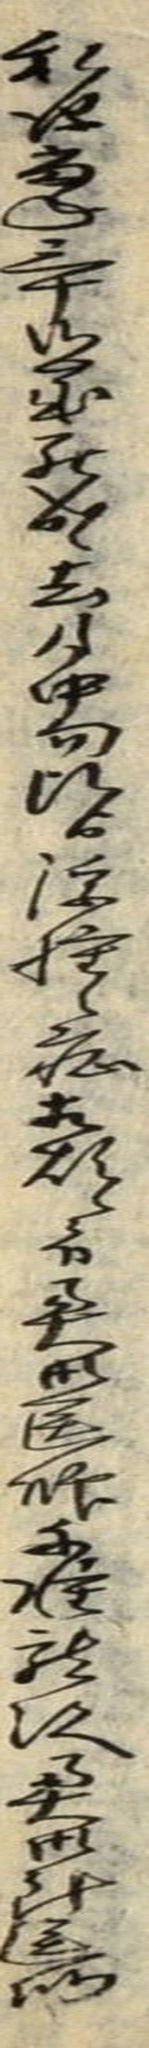私儀当年三十弐歳罷成候去月中旬頃ゟ浮腫之症相煩候ニ付奥御医師千種竜沢奥御針医師
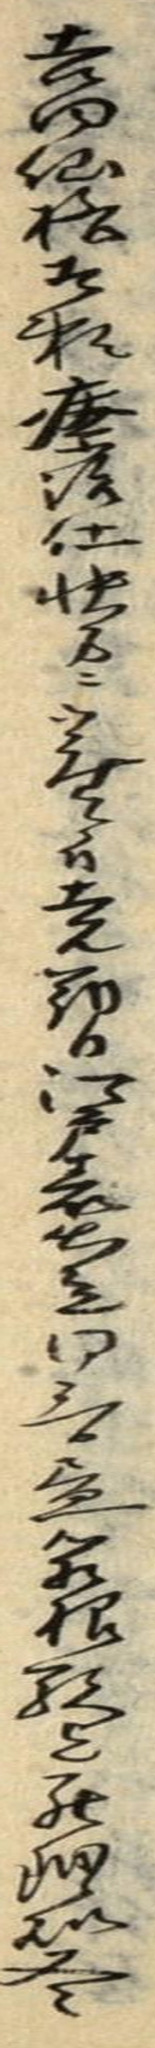吉田仙格相頼療治仕快方ニ御座候ニ付去ル朔日江戸表出立同三日箱根駅迄罷越候処又々

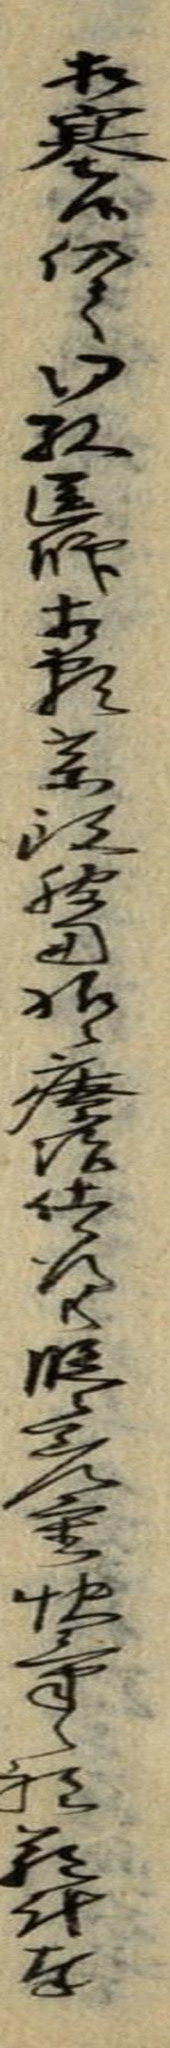相塞候仍之同駅医師相頼薬致服用様ニ療治仕候得共段々差重快気之程難計奉
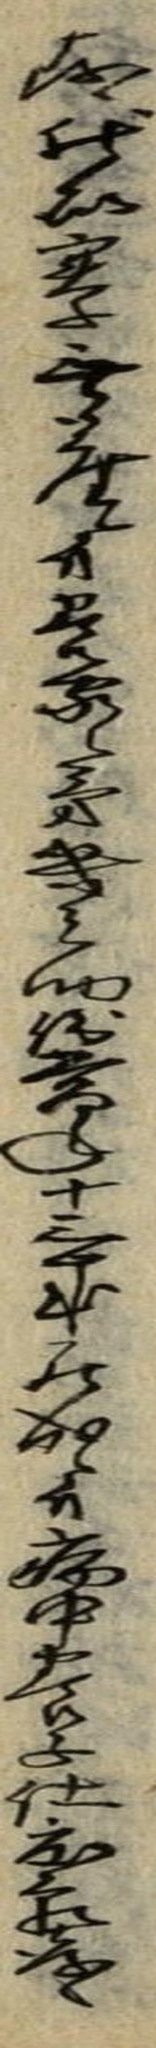存候然処実子無御座候ニ付養家之弟幾之助儀当年十三歳罷成候ニ付病中養子仕度願奉存候
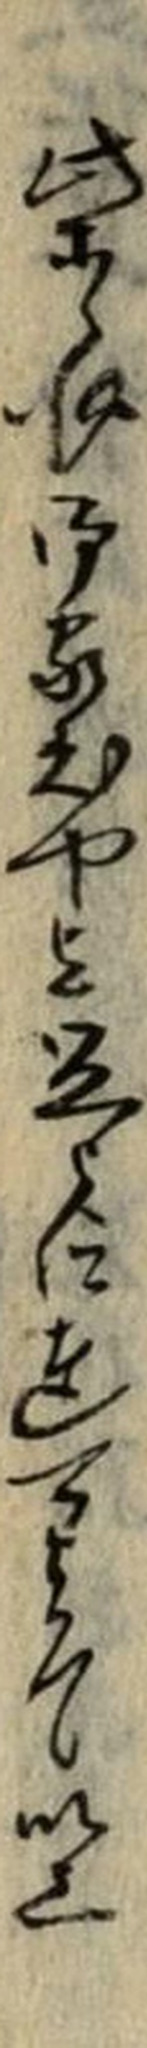此等之趣御家老中迄宜被仰達可被下候以上
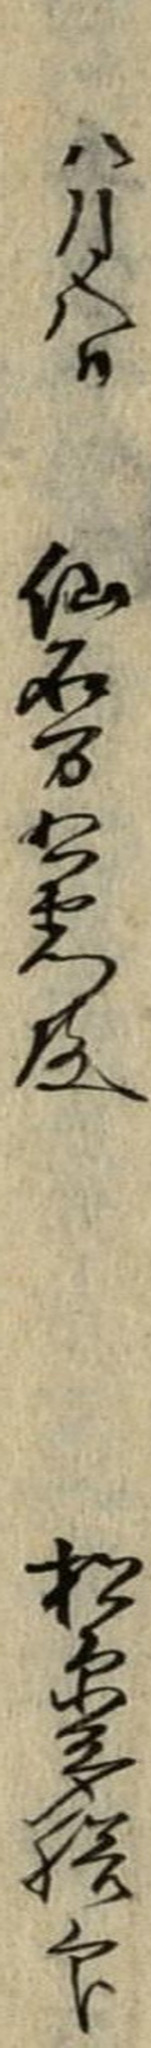八月八日仙石万右衛門殿松原多膳印
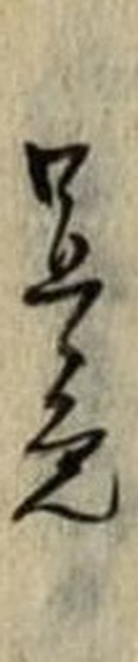口上之覚
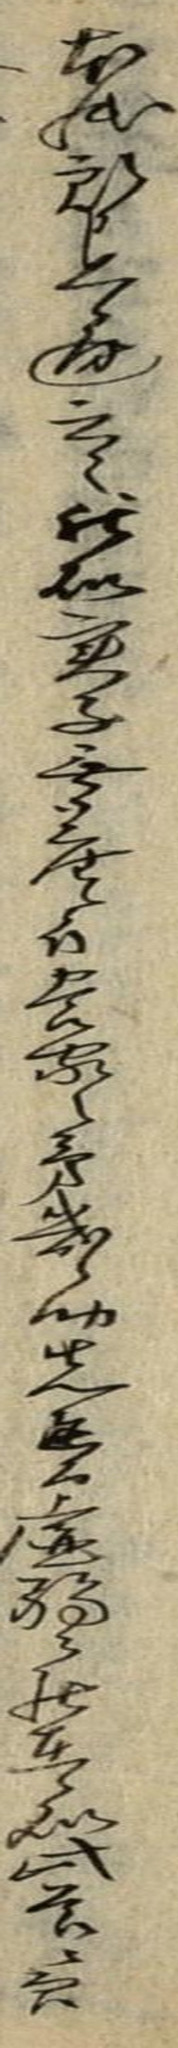本紙願申上候通云々然処実子無御座候ニ付養家之弟幾之助先達而虚弱ニ罷在候処此節ニ而ハ
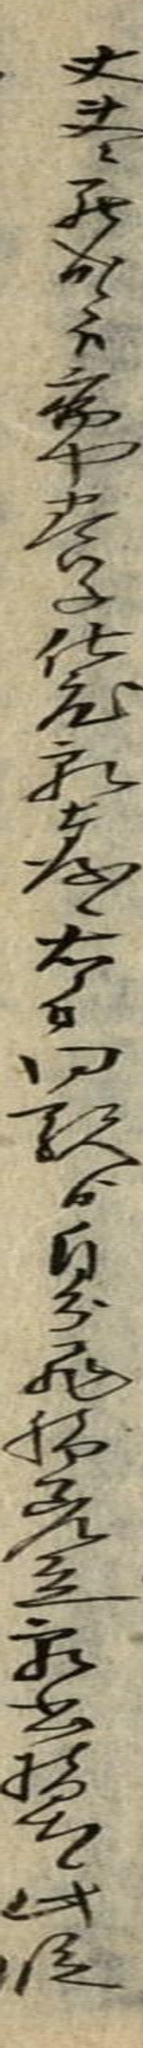丈夫ニ罷成候ニ付病中養子仕度願奉存候右ニ付同駅ゟ自分飛脚差立願書指出候此段
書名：養子縁組之部
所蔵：福井県文書館 Fukui Prefectural Archives
